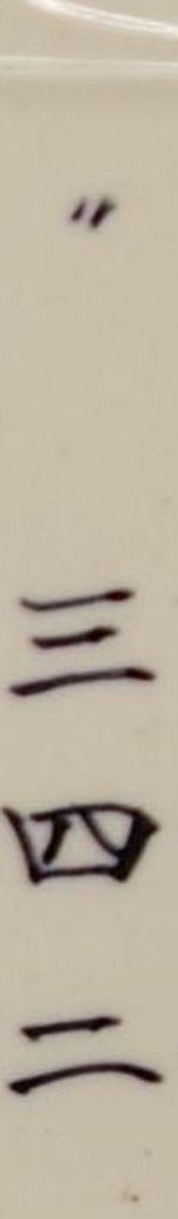三四二
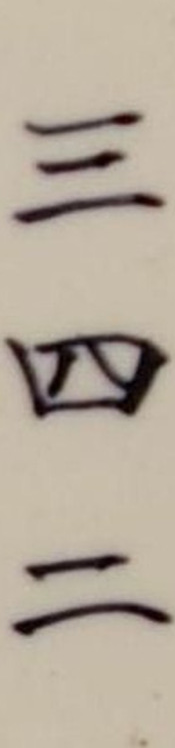三四二
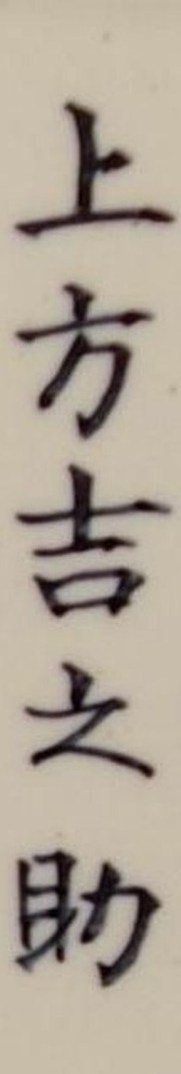上方吉之助
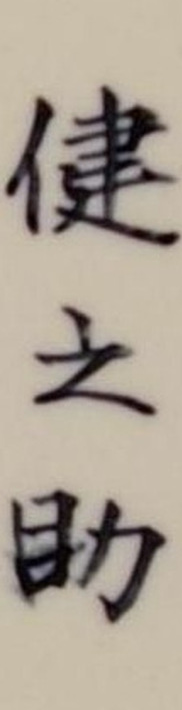健之助
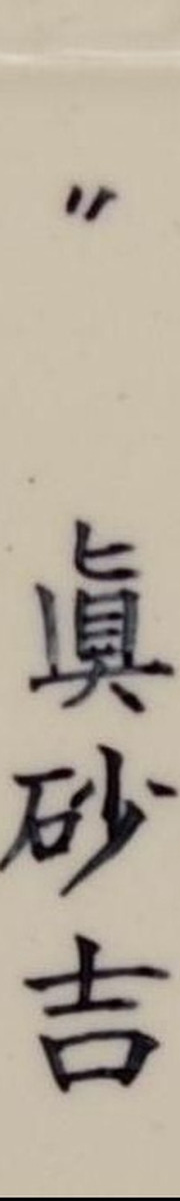真砂吉
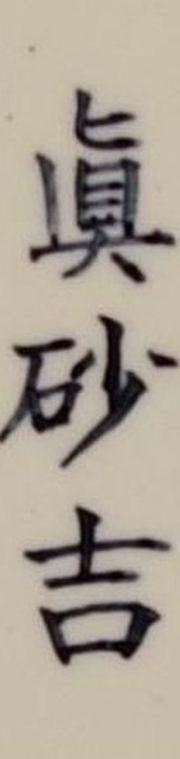真砂吉
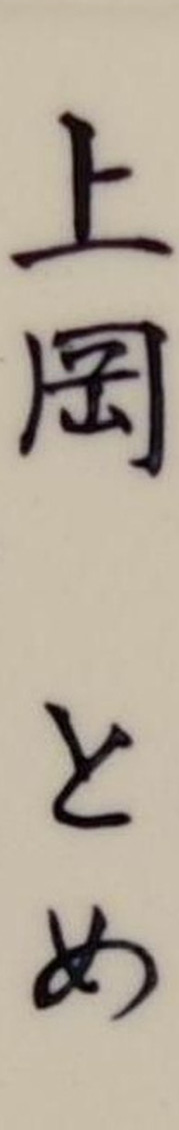上岡とめ
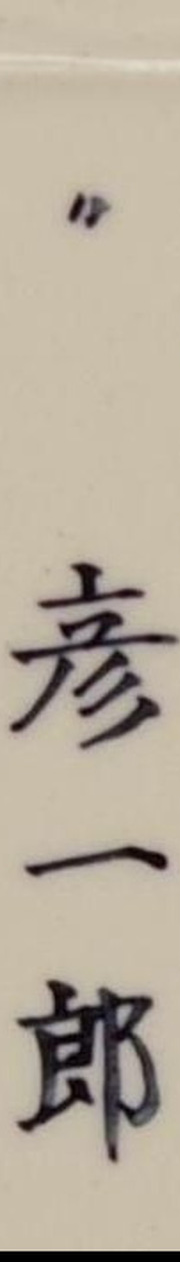彦一郎
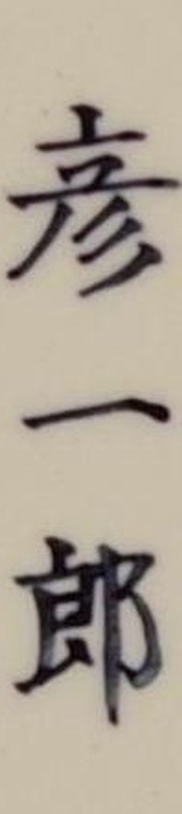彦一郎
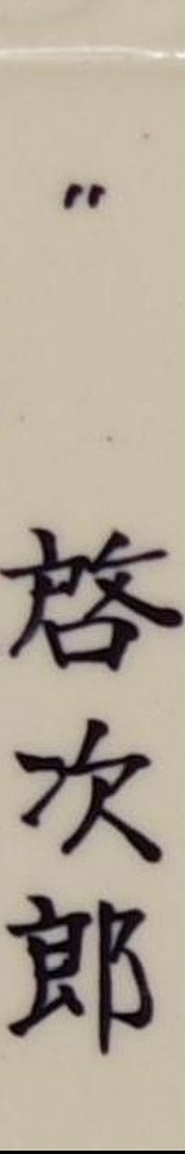啓次郎
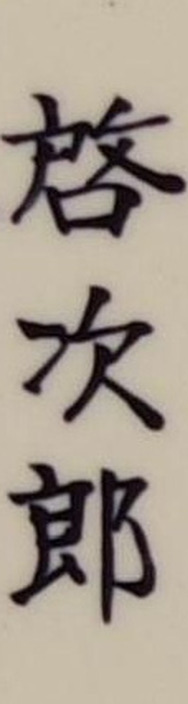啓次郎
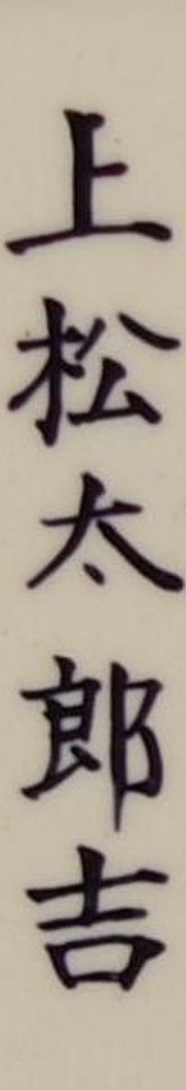上松太郎吉
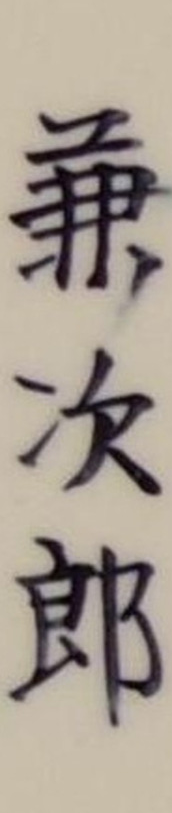兼次郎
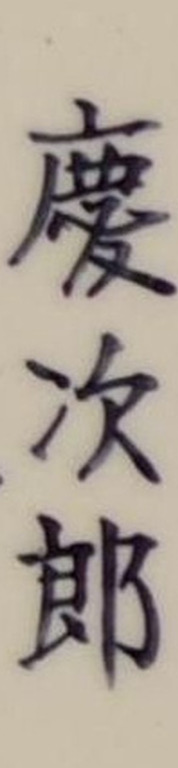慶次郎

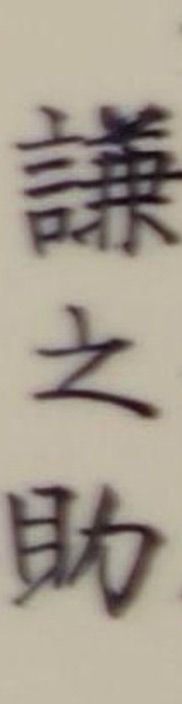謙之助
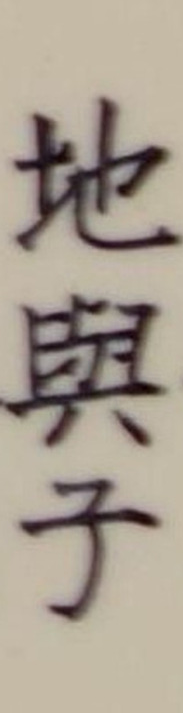地与子
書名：M~S
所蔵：高野山金剛峯寺
